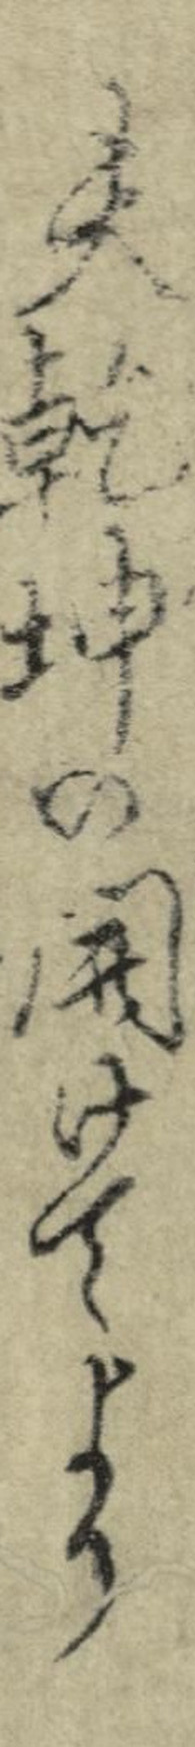夫乾坤の開けてより
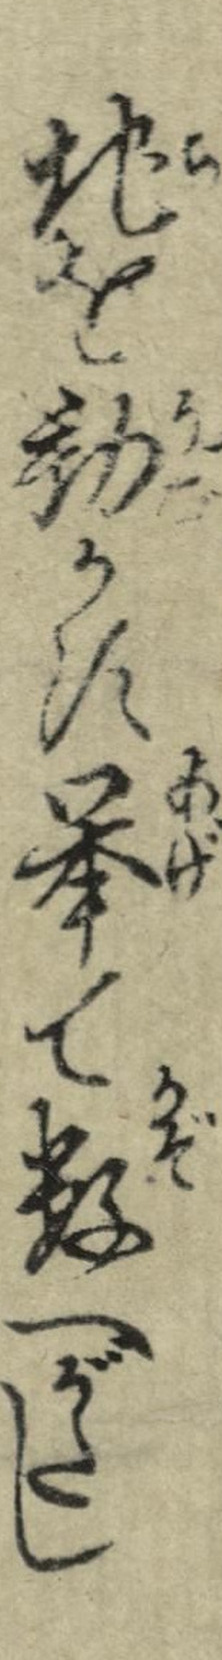地を動かす挙て数へがたし
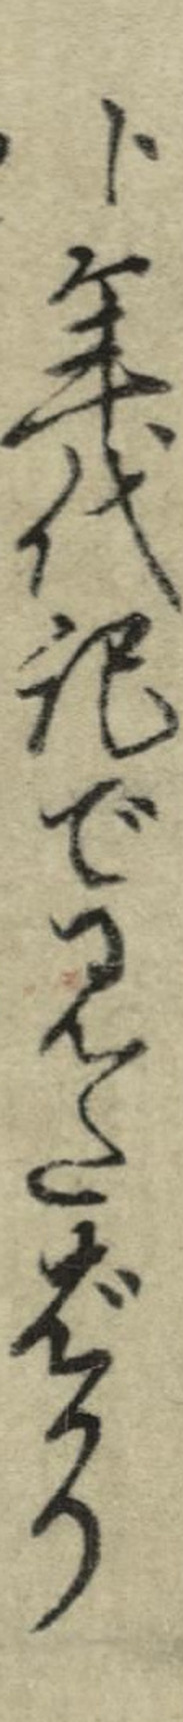と年代記で見たばかり
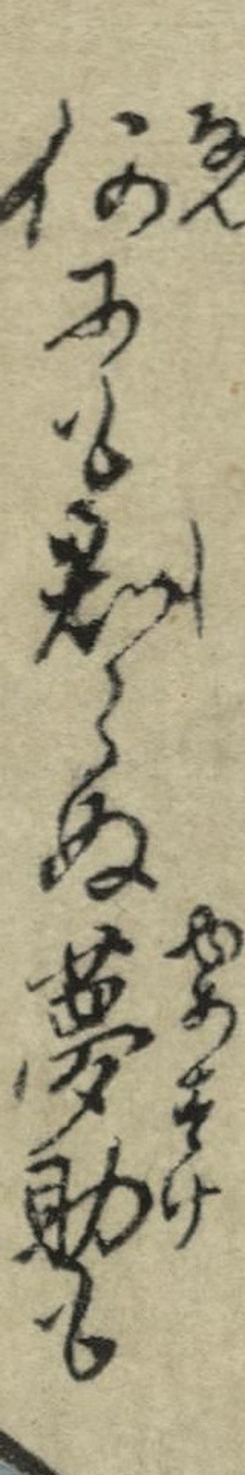何にも知らぬ夢助も
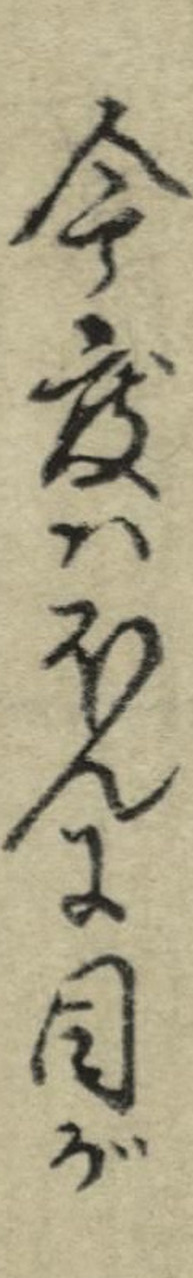今度はほんに目が
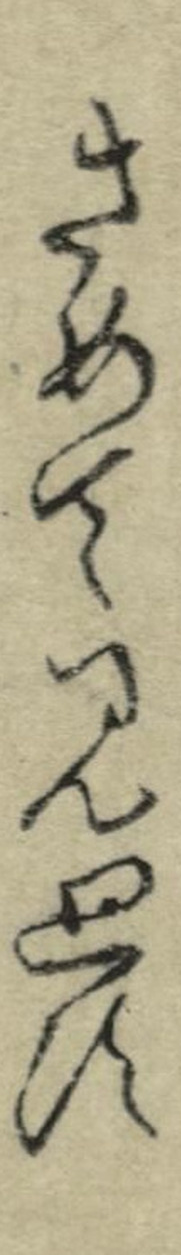さめて見廻す
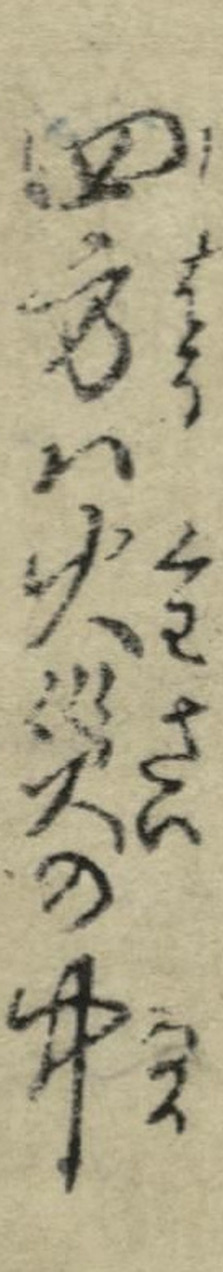四方は火災の中
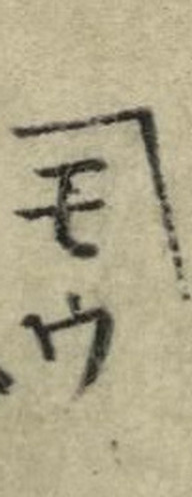〽モウ
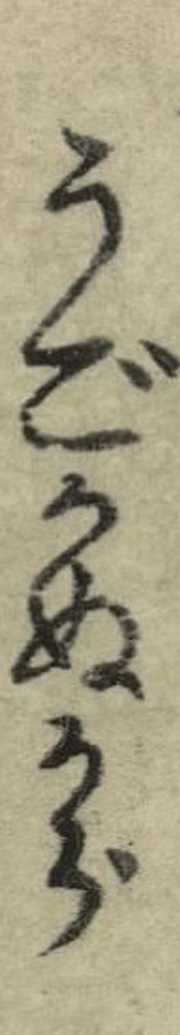うごかぬから
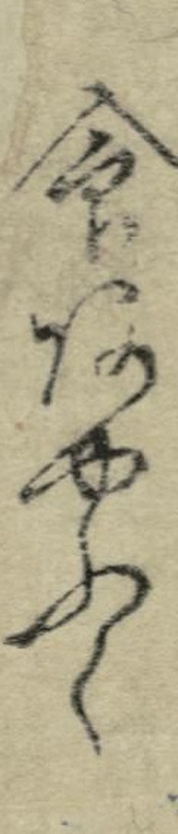命あやふく
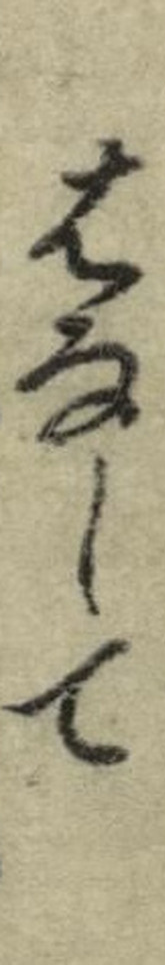はなして
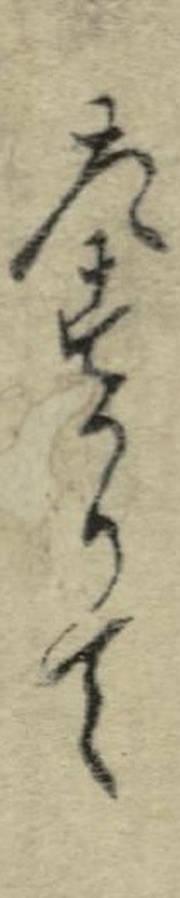たすかりて
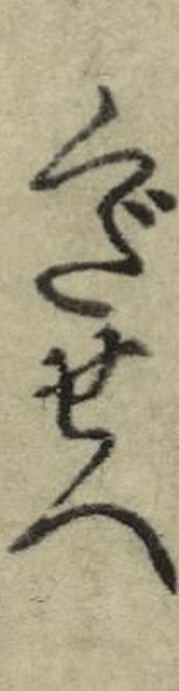くだせへ
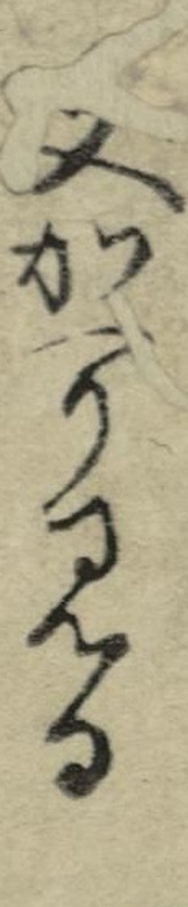又かへり見る
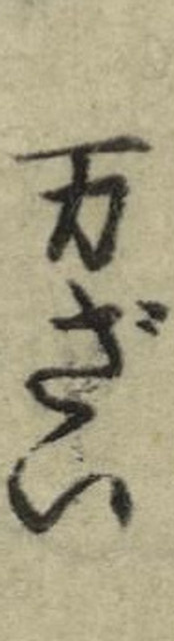万ざい
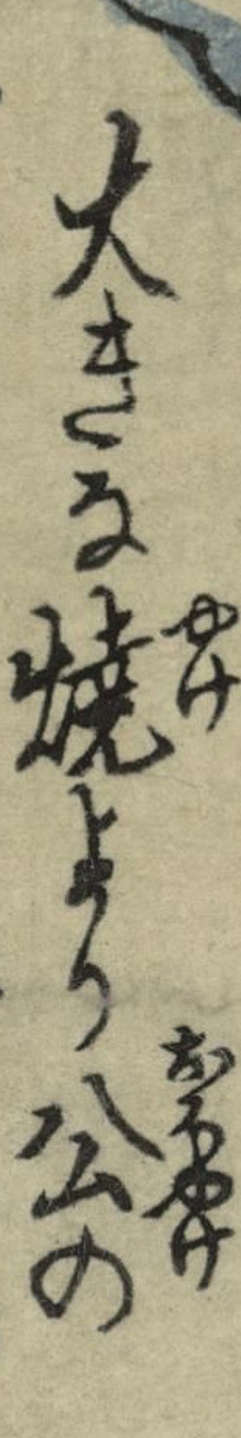大きな焼より公の
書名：[大黒のつち]
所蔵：東京大学地震研究所図書室 Earthquake Research Institute Library, The University of Tokyo, JAPAN
